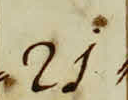21
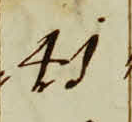41
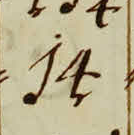14
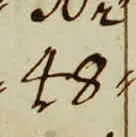48
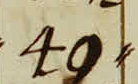49
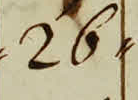26
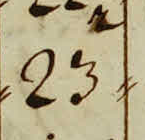23
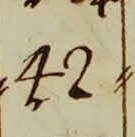42
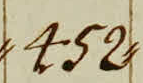452
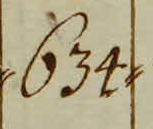634
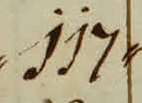117
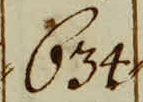634
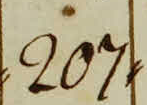207
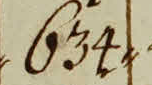634
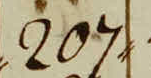207
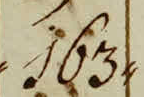163
